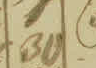30
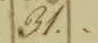31.
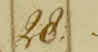28.
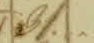31.
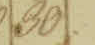30
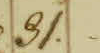31.
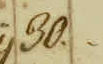30.
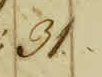31.
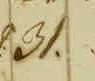31.
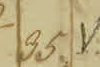35.
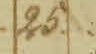25.
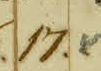17.
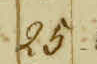25
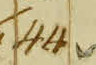44
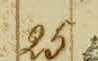25
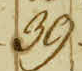39
